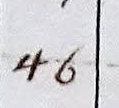46
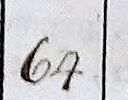64
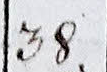38
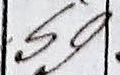59
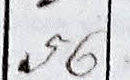56
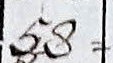58
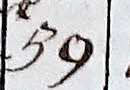59
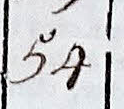54
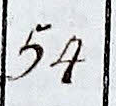54
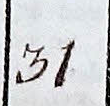31
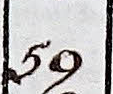59
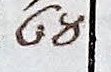68
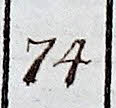74
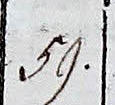59
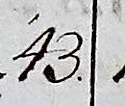43.
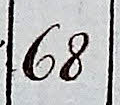68
